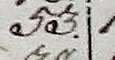53.
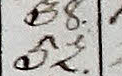52.
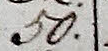50.
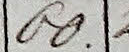60.
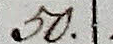50.
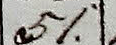51.
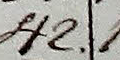42.
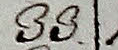33.
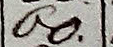60.
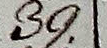39.
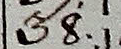38.
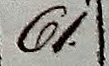61.
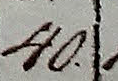40.
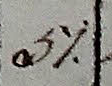51.
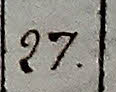27.
